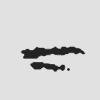二
